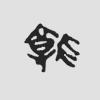融
